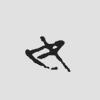女
